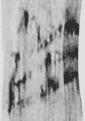於
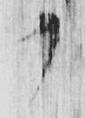人
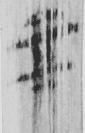不
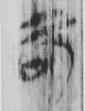可
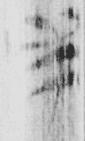求（救）
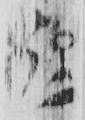桯（楹）
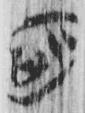名（銘）
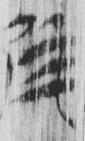隹（唯）
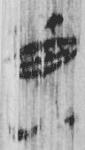母
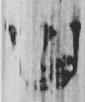曰
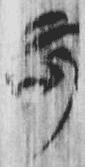可（何）
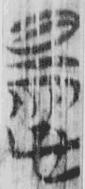愓（傷）
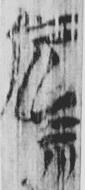○（禍）
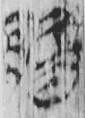𨟻（將）
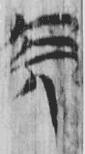長
